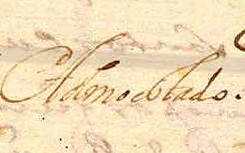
Admoestado.
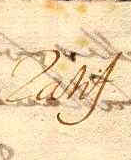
Ratif
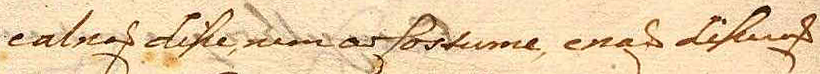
e al naõ disse, nem ao Costume, e naõ disseraõ
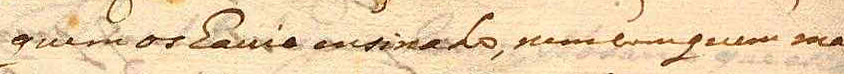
quem os hauia ensinado, nem com quem ma
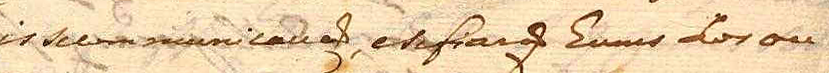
is se communicauaõ, e se fiaraõ hums dos ou
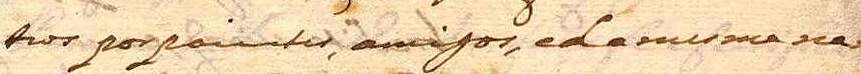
tros por parentes, amigos, e da mesma na
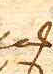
çaõ.
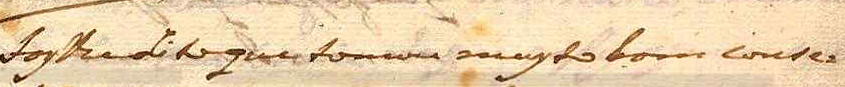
Foylhe dito que tomou muyto bom conse
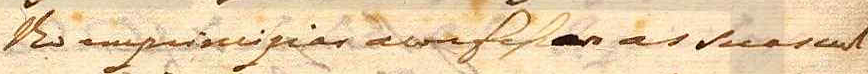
lho em principiar a confessar as suas cul
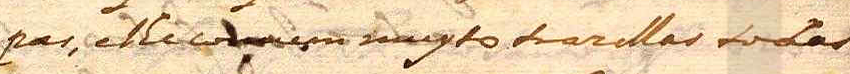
pas, e lhe conuem muyto trazellas todas
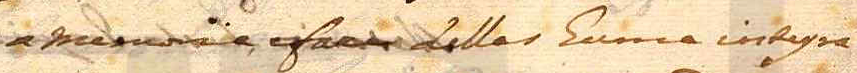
a memoria, e fazer dellas huma inteyra
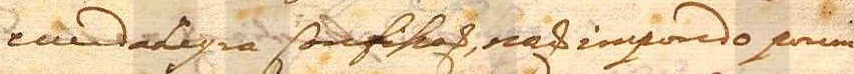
e uerdadeyra Confissão, naõ impondo porem
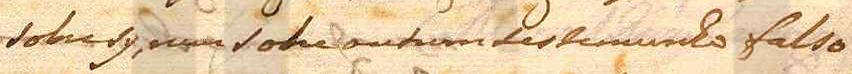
sobre sy, nem sobre outrem testemunho falso
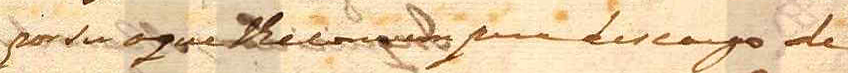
por ser o que lhe conuem pera descargo de
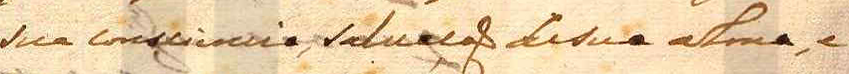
sua consciencia, saluaçaõ de sua alma, e
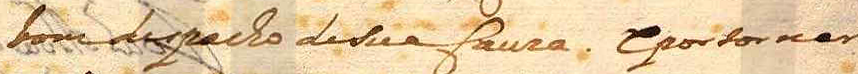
bom despacho de sua Cauza. E por tornar
